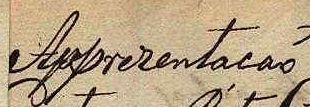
Apprezentaçaõ
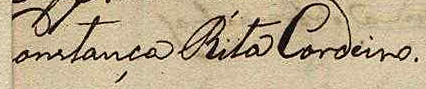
onstança Rita Cordeiro.
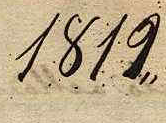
1819.
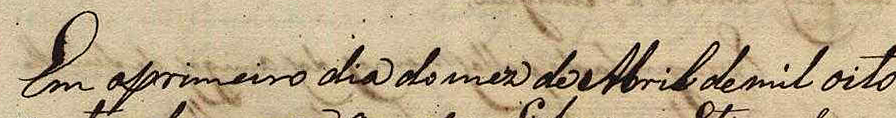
Em o primeiro dia do mez de Abril de mil oito
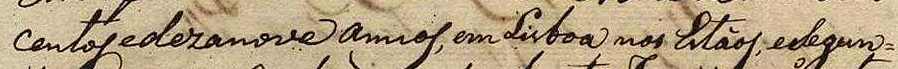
centos e dezanove annos, em Lisboa nos Estáos, e Segun
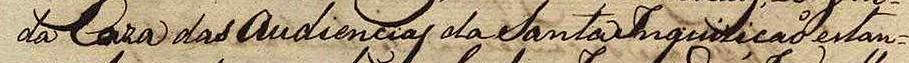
da Caza das Audiencias da Santa Inquiziçaõ estan
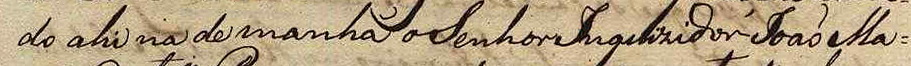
do ahi na de manhã o Senhor Inquizidor Ioaõ Ma
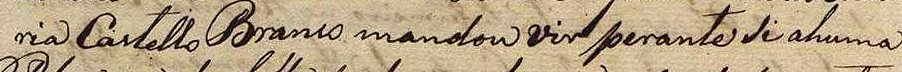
ria Castello Branco mandou vir perante si a huma
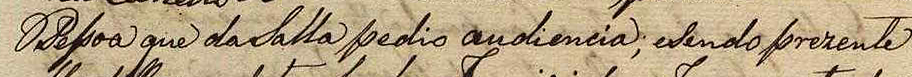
Pessoa que da Salla pedio audiencia; e sendo prezente
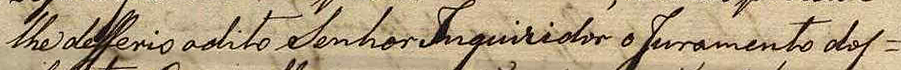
lhe defferio o dito Senhor Inquizidor o Juramento dos
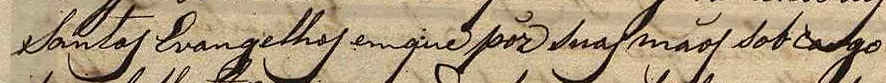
Santos Evangelhos em que põz suas maõs sob cargo
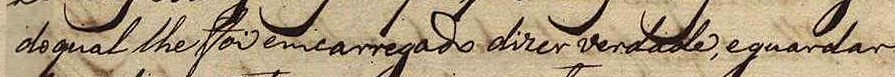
do qual lhe foi emcarregado dizer verdade, e guardar
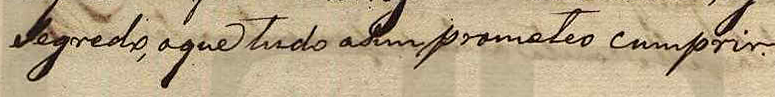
segredo, a que tudo asim prometeo cumprir.
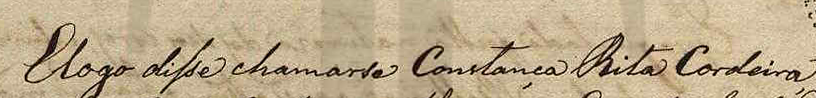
E logo disse chamarse Constança Rita Cordeira,
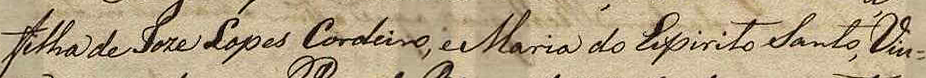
filha de Ioze Lopes Cordeiro, e Maria do Espirito Santo, Viu
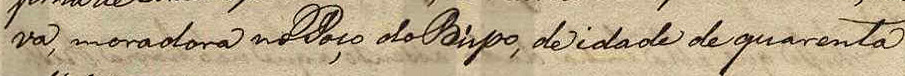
va, moradora no Poço do Bispo, de idade de quarenta
